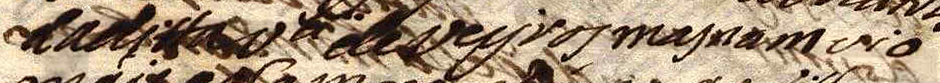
da ditta v.a de veyros mas nam vio
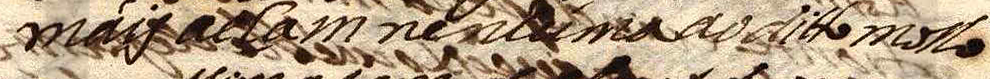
mais acCam nenhuma ao ditto mosso
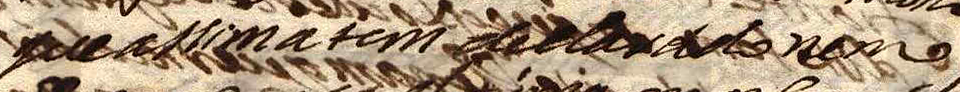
que assima tem declarado nem
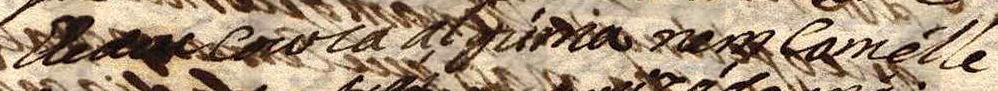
lhe deu couza alguma, nem com élle
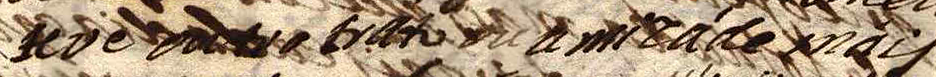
teve outro trato ou amizade mais
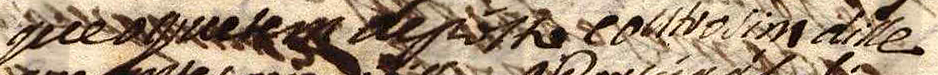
que o que tem deposto, e outrosim disse
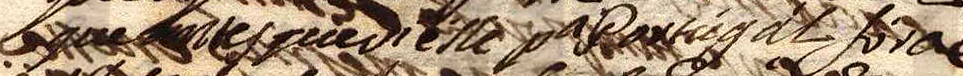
que antes que viesse pa Portugal fora
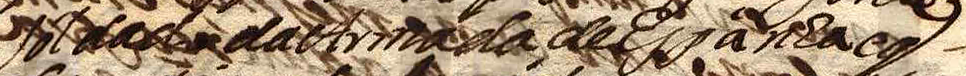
soldado da Armada de Espanha e q̄
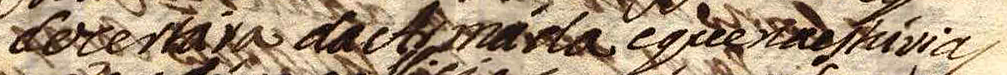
dezertara da Armada, e que na estúrias
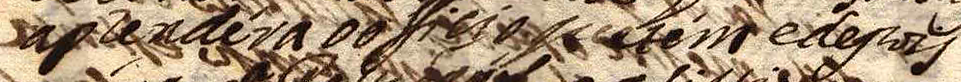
aprendera o officio que tem e depois
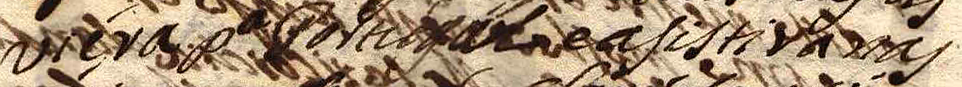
viera pa PortugaL, e asistira nas
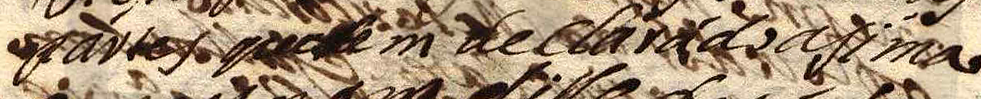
partes que tem declarado asima
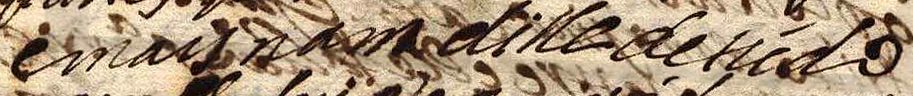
e mais nam disse de tudo
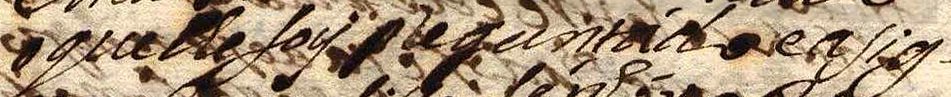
o que lhe foy preguntado e asig
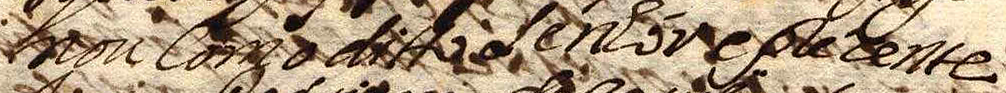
nou Com o ditto Senhor e prezente
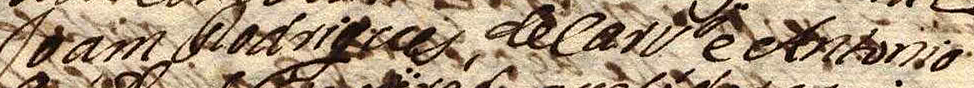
Joam Rodrigues de carvo e Antonio
